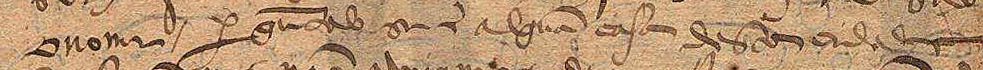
o nome / ꝑḡutado se ē algūa casa desta cidade
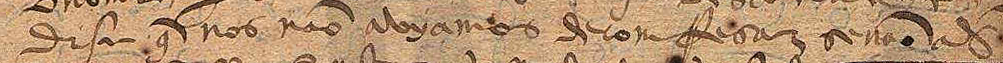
dise q̅ nos não avyamos de comfesar senão a ds̄
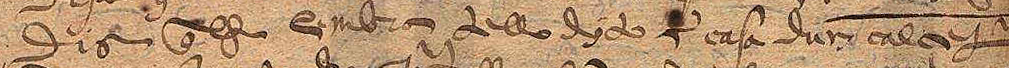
dise q̅ lhe lembra tello dyto ē casa dum calcetro
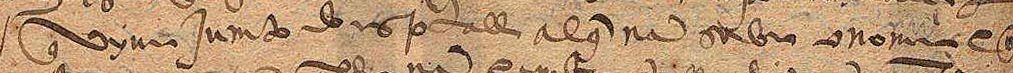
q̄ vyue Jumto do esp̅tall al q̄ nā sabe o nome e q̅
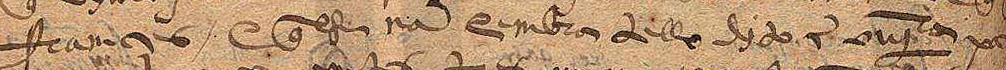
framces / e q̅ lhe na̅ lembra tello dyto e̅ outra par
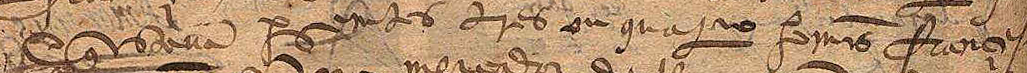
E q̄ estauā ꝑsemtes tres ou quatro homēs franceses
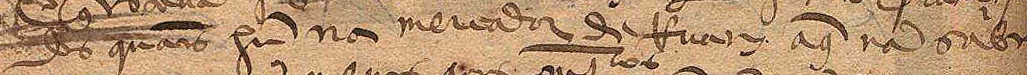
dos quāes hu̅ era mercador de Ruam a q̅ na̅ sabe
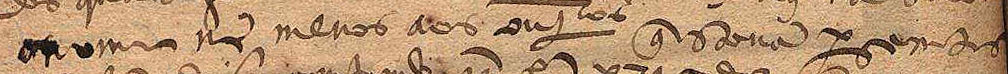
o nome ne̅ menos aos outros q̅ estauā ꝑsemtes
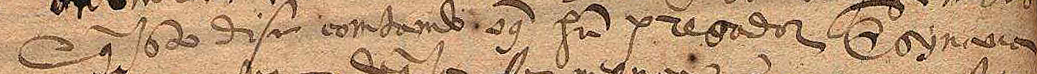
e q̅ Jsto dise comtamdo o q̄ hū pregador ēsynaua
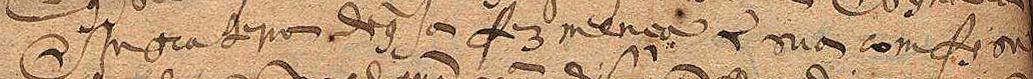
ē Jngraterra de q̄ Ja fez mençā e̅ sua comfisa
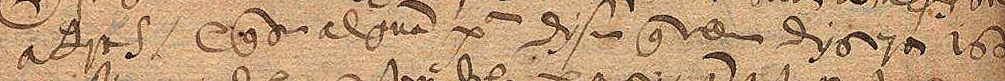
atras / e q̅ se algūa pa dyse q̄ elle dysera ist
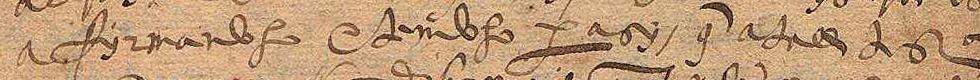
afyrmandoho e temdoho ꝑa sy / q̅ a tall testa
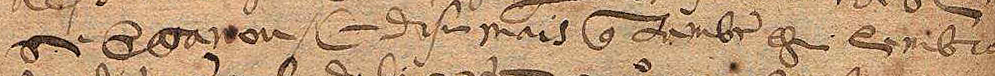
se ēganou / E dise mais q̅ tambē lhe lembra
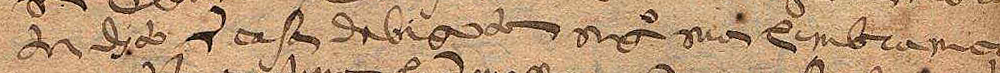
ter dyto e̅ casa dabigota sego sua lembramça
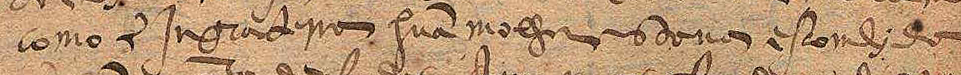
como e̅ Jngraterra hu̅a molher estaua escomdyda
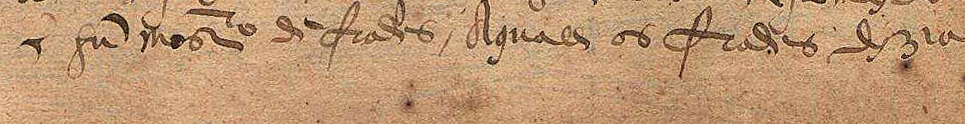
ē hū mostro de frades / A quall os frades dyziā
